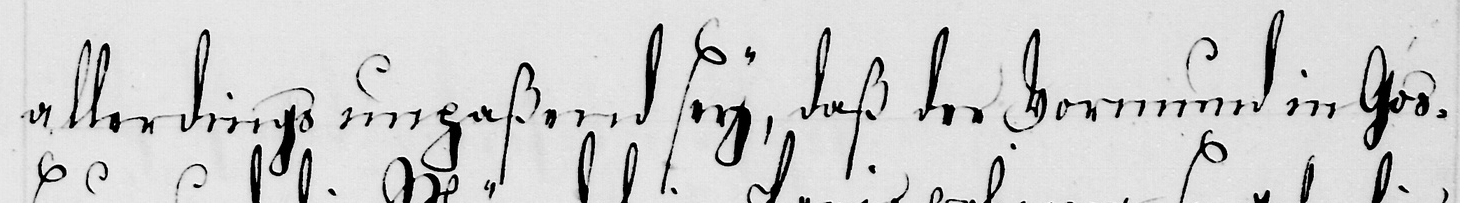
allerdings unpaßend sey, daß der Vormund in Gos¬
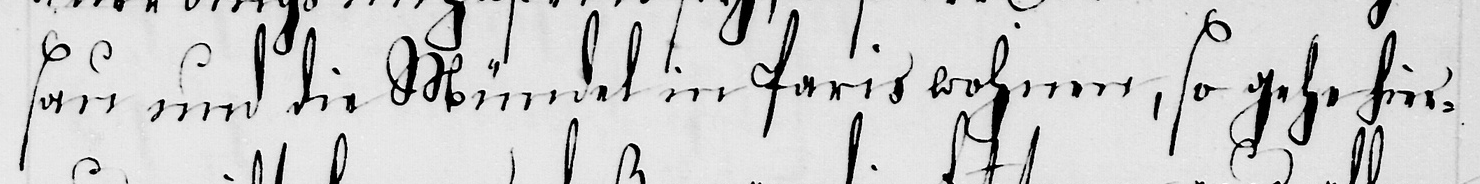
sau und die Mündel in Paris wohnen, so gehe hier¬
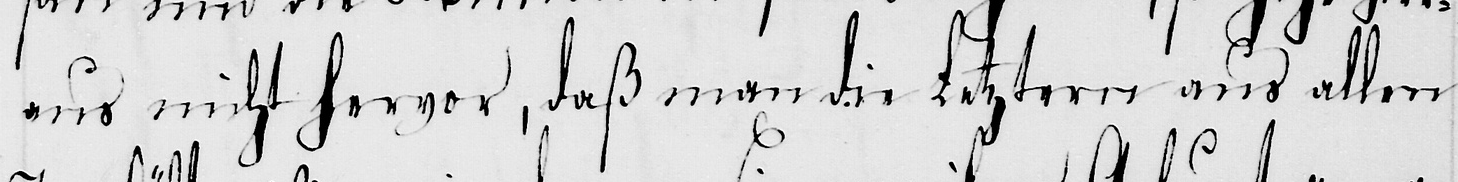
aus nicht hervor, daß man die Letztern aus allen
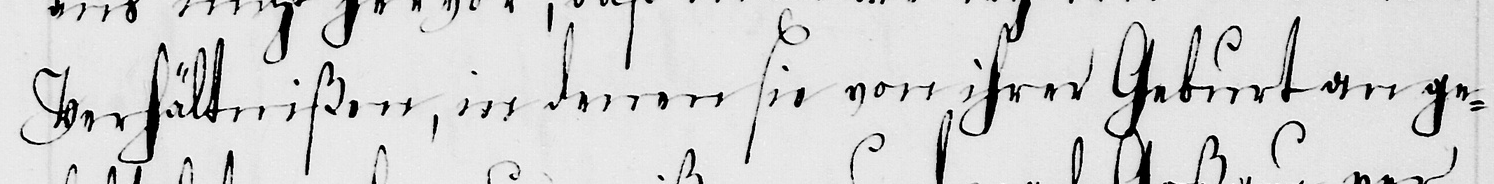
Verhältnißen, in denen sie von ihrer Geburt an ge¬
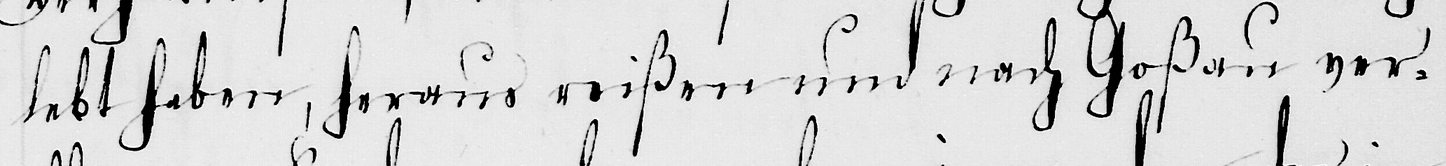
lebt haben, heraus reißen und nach Goßau ver¬
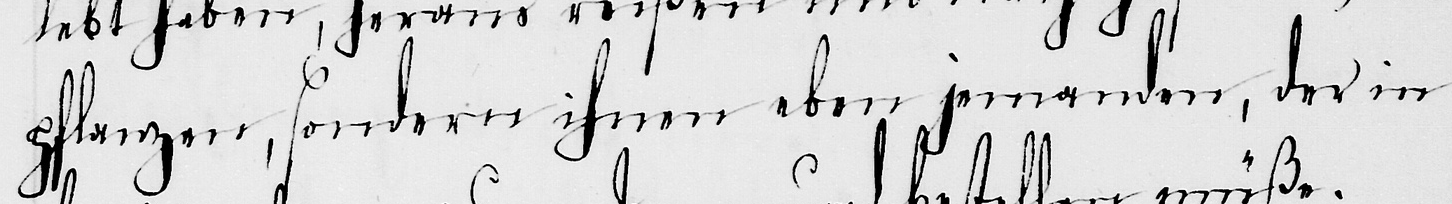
pflanzen, sondern ihnen eben jemanden, der in
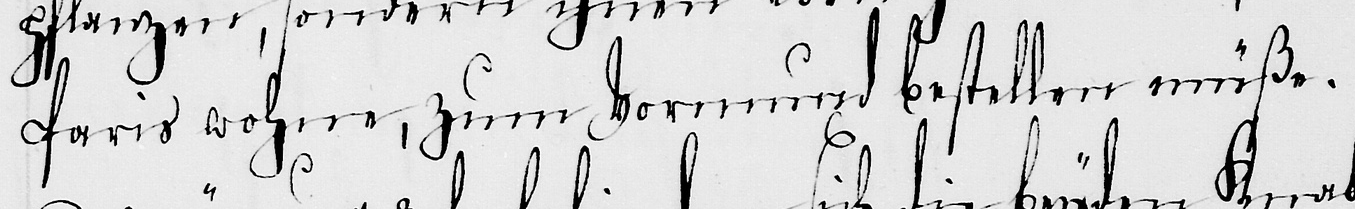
Paris wohne, zum Vormund bestellen müße.
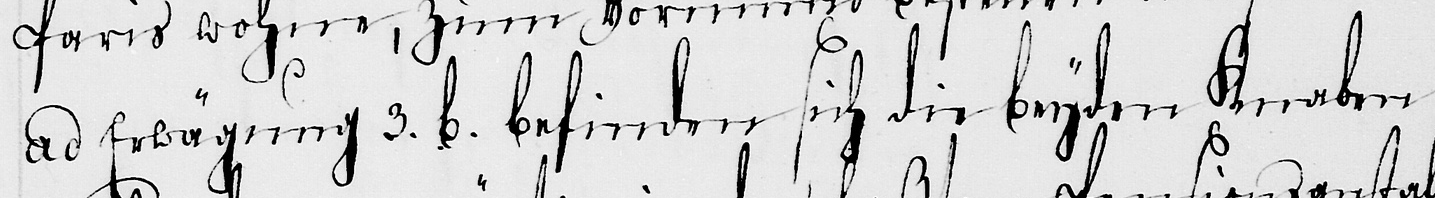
ad Erwägung 3. b. befinden sich die beyden Knaben
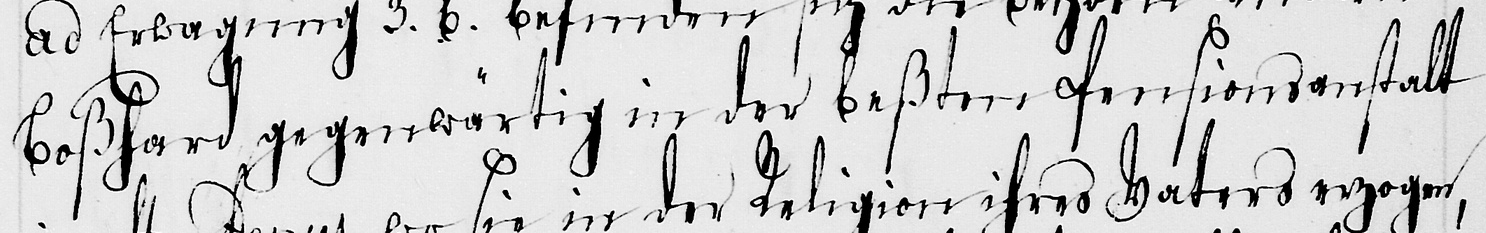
Boßhard gegenwärtig in der beßten Pensionsanstalt
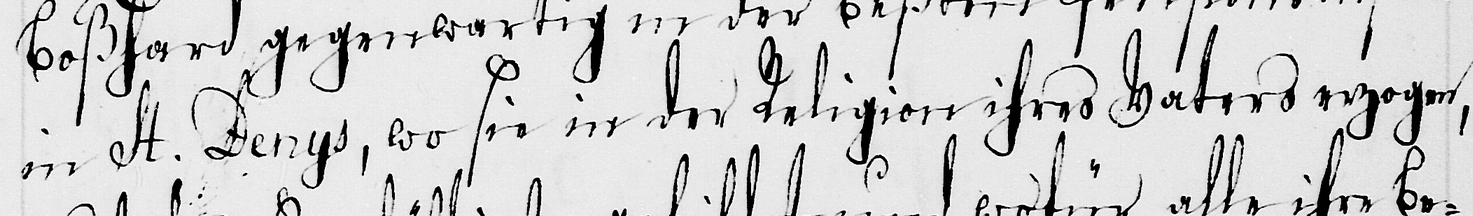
in St. Denys, wo sie in der Religion ihres Vaters erzogen,
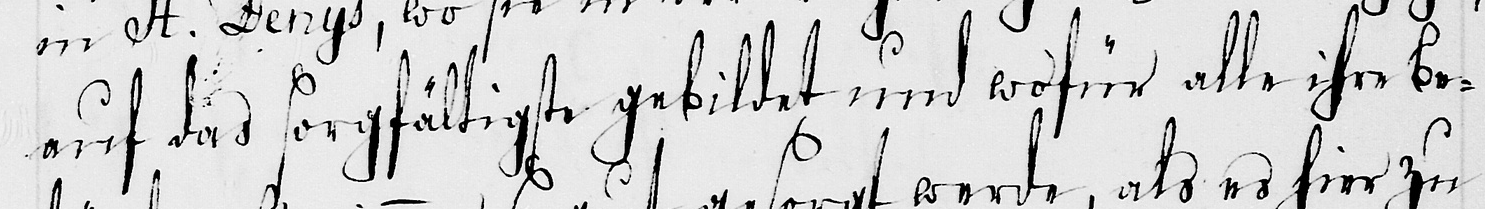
auf das sorgfältigste gebildet und wofür alle ihre B¬
